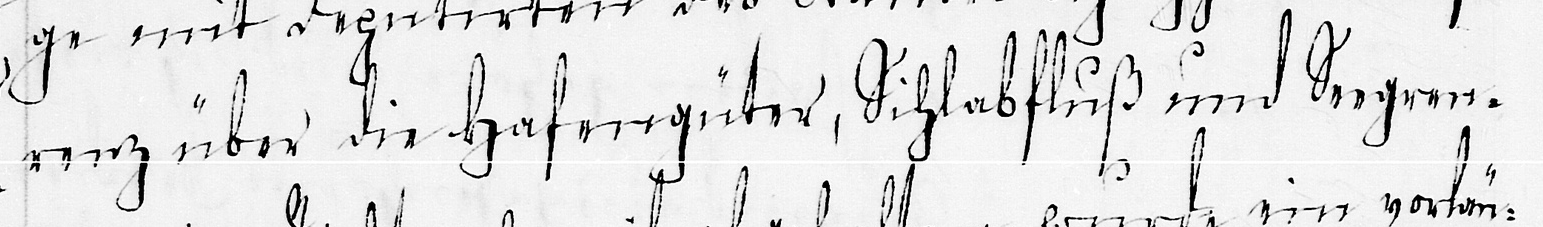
renz über die Hafengüter, Sihlabfluß und Seegren¬
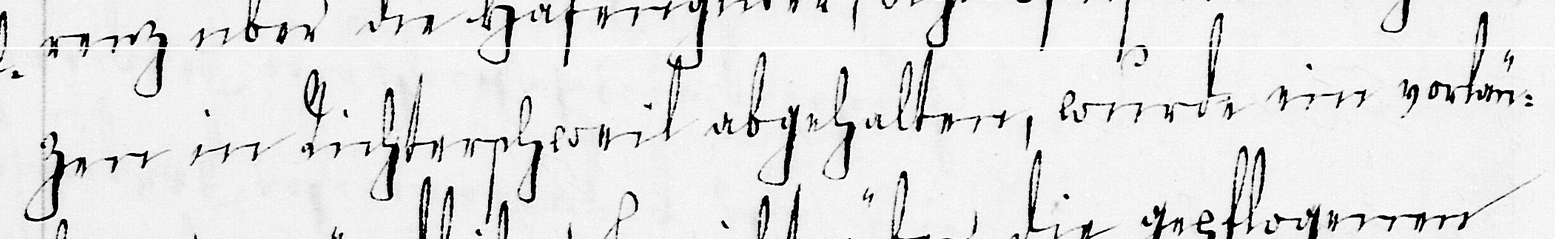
zen in Richterschweil abgehalten, wurde ein vorläu¬
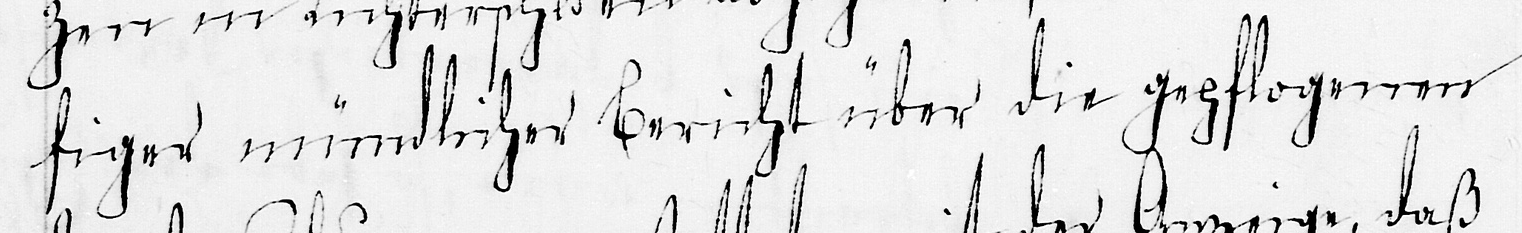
figer mündlicher Bericht über die gepflogenen
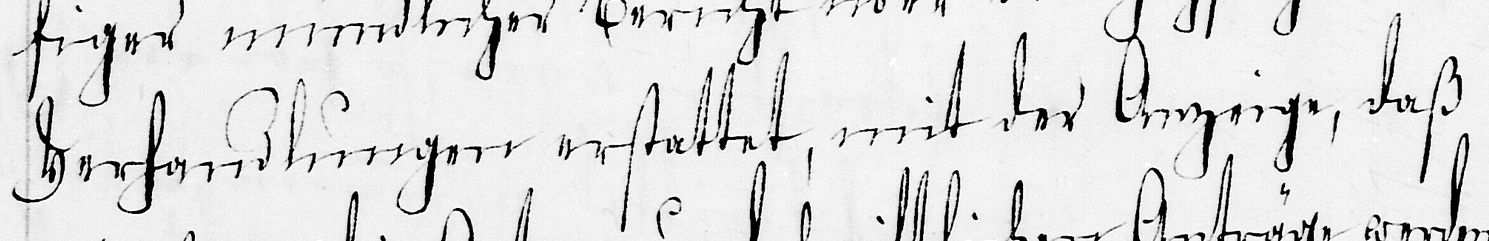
Verhandlungen erstattet, mit der Anzeige, daß
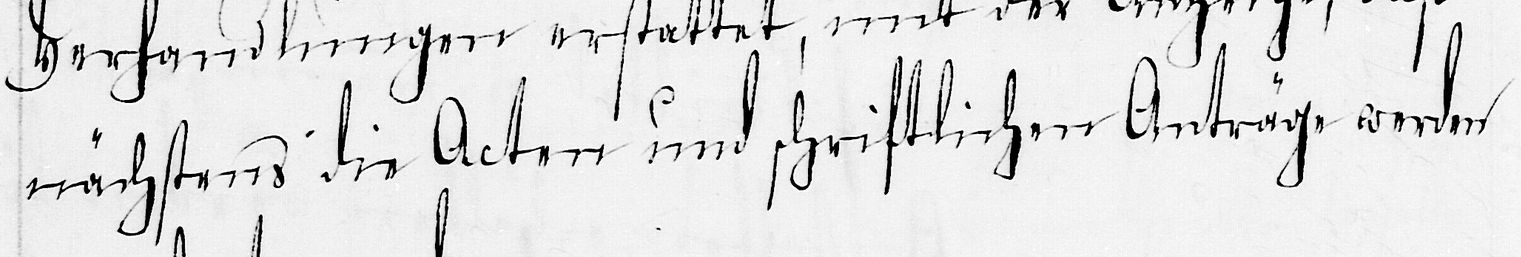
nächstens die Acten und schriftlichen Anträge werden
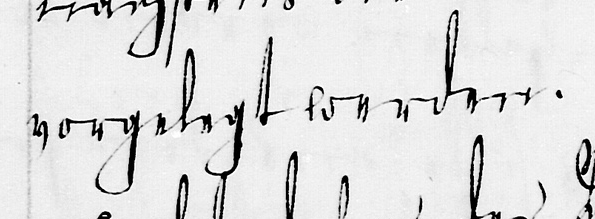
vorgelegt werden.
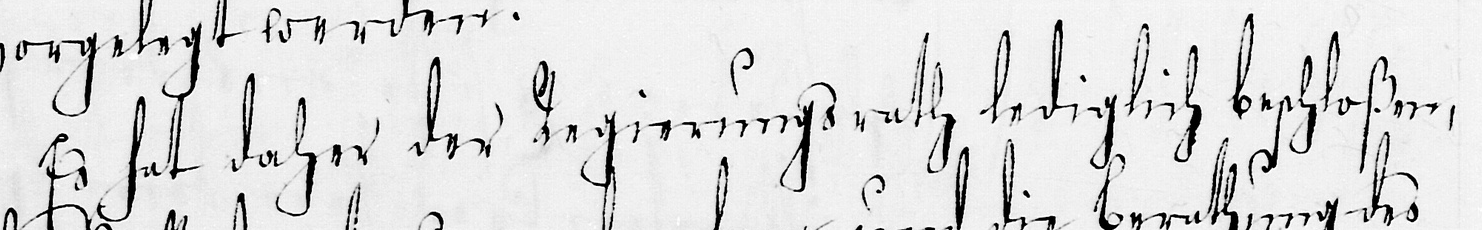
Es hat daher der Regierungsrath lediglich beschloßen,
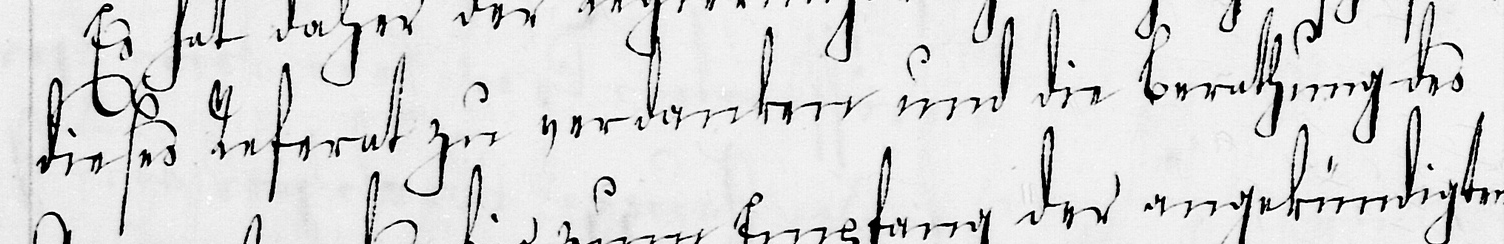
dieses Referat zu verdanken und die Berathung des
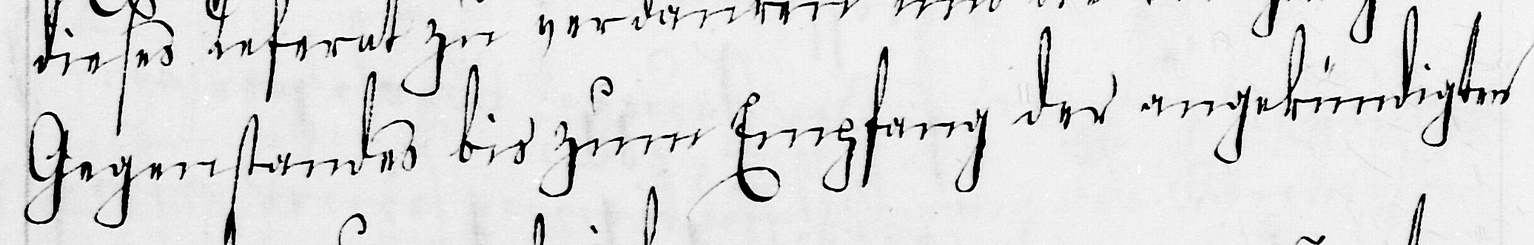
Gegenstandes bis zum Empfang der angekündigten
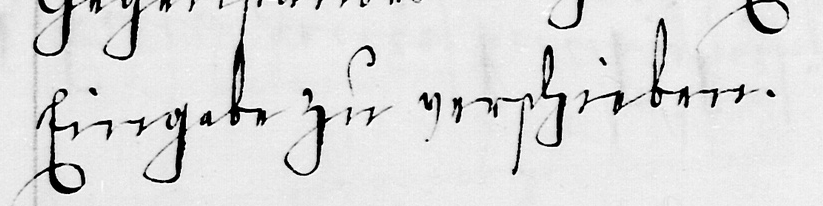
Eingabe zu verschieben.
